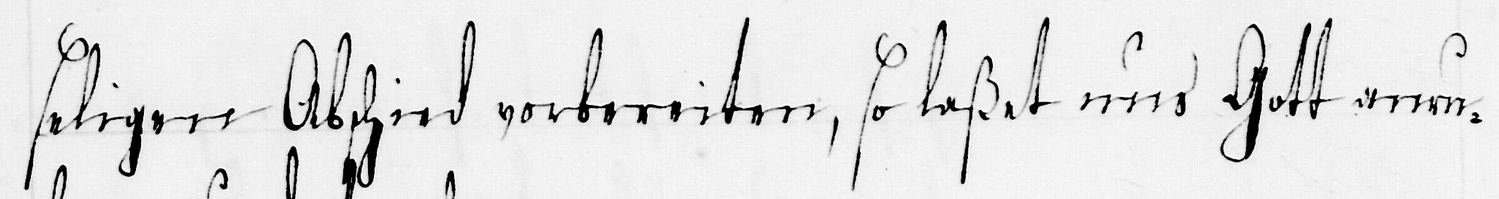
seligen Abschied vorbereiten, so laßet uns Gott anru¬
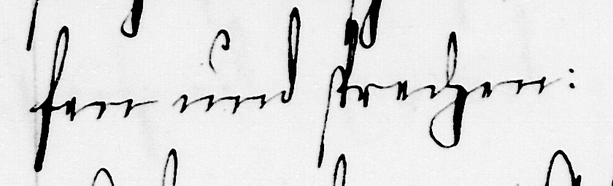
fen und sprechen:
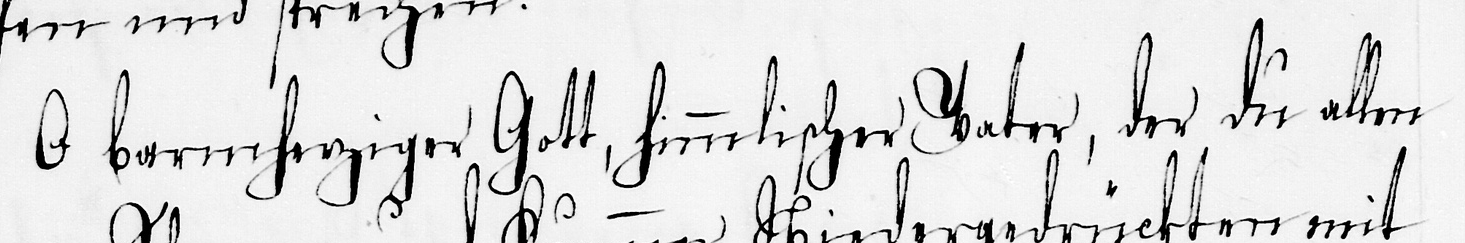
O barmherziger Gott, himmlischer Vater, der du allen
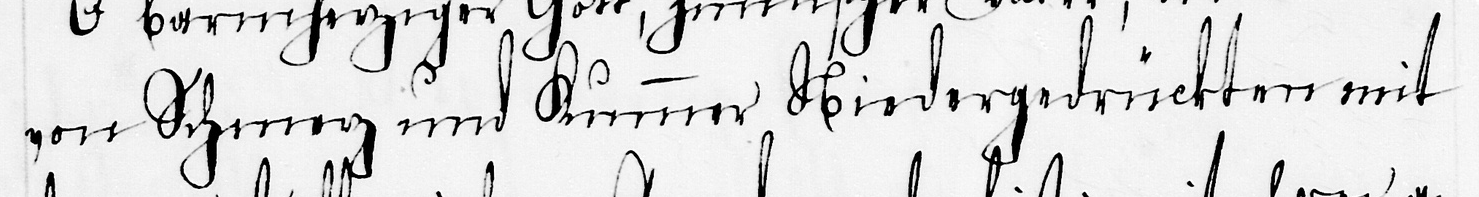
von Schmerz und Kummer Niedergedrückten mit
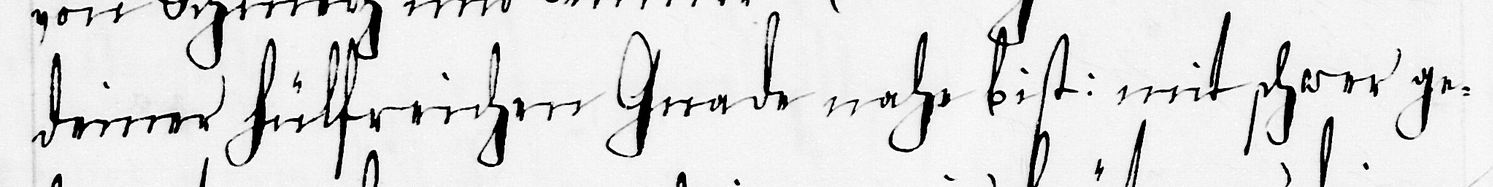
deiner hülfreichen Gnade nahe bist: mit schwer ge¬
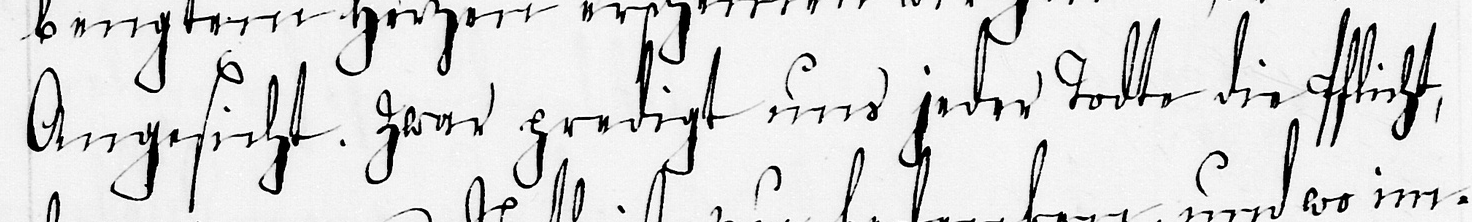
Angesicht. Zwar predigt uns jeder Todte die Pflich¬
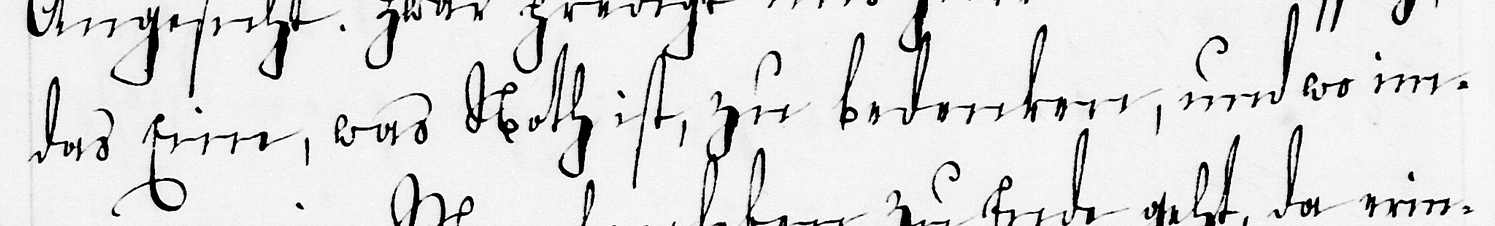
das Eine, was Noth ist, zu bedenken, und wo im¬
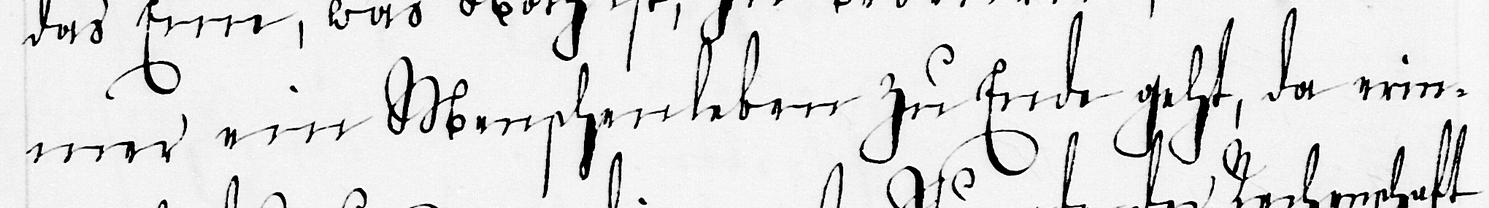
mer ein Menschenleben zu Ende geht, da erin¬
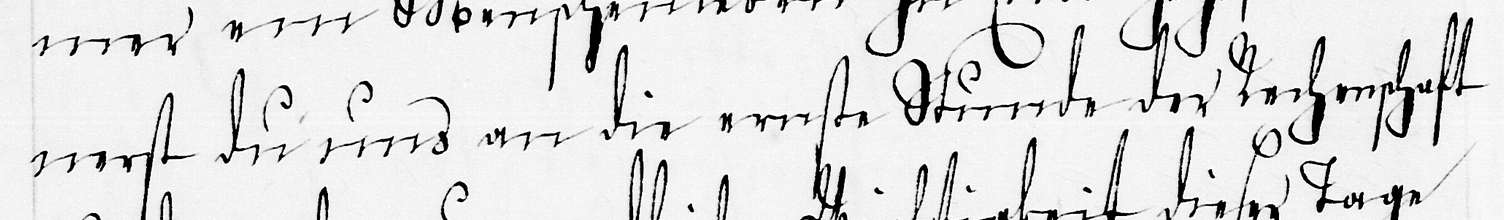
nerst du uns an die erste Stunde der Rechenschaft
